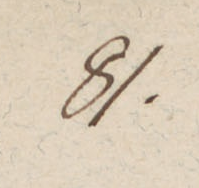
81.
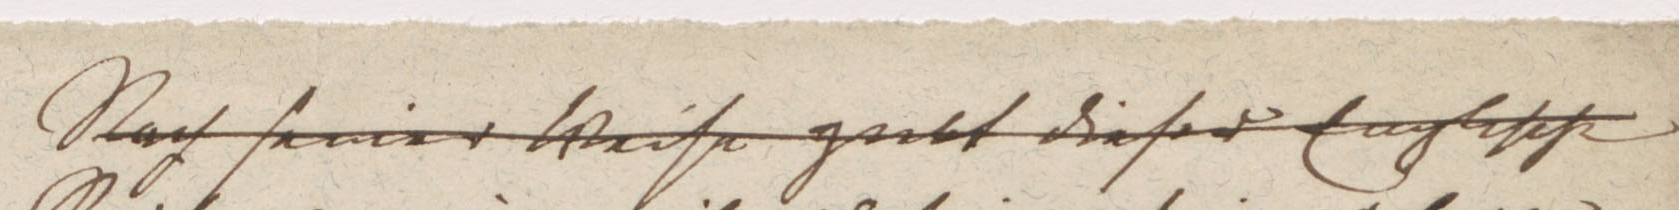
Nach seiner Weise giebt dieser Englisch
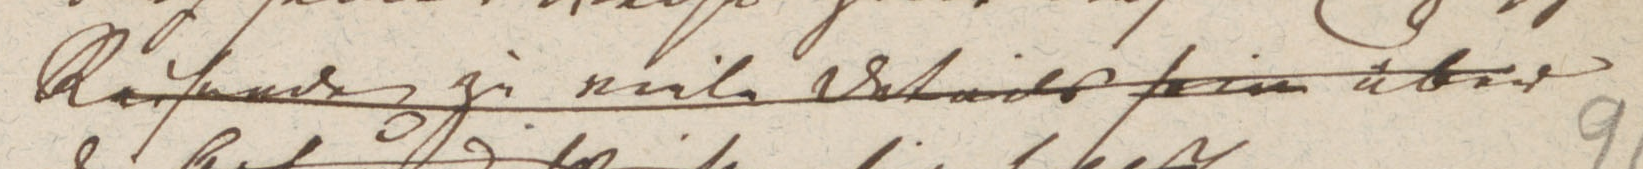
Reisende zu viele Details sein über
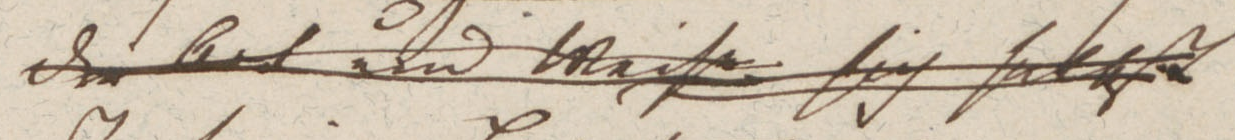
die Art und Weise sich selbst
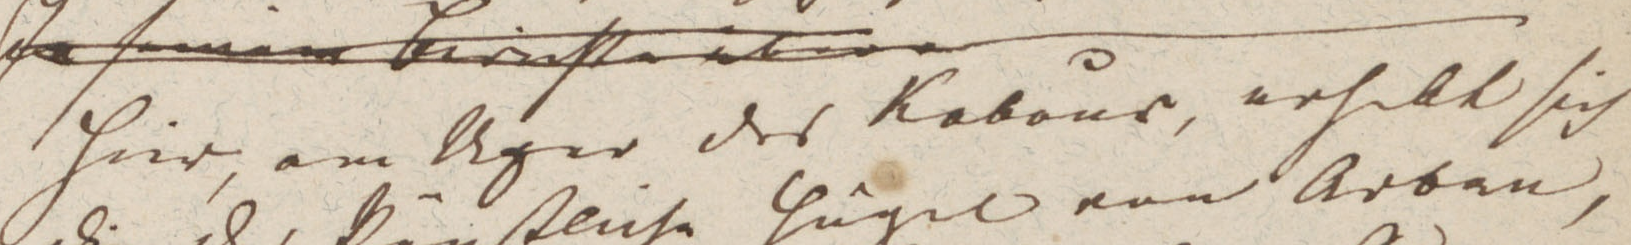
Hier, am Ufer des Kabour, erhebt sich
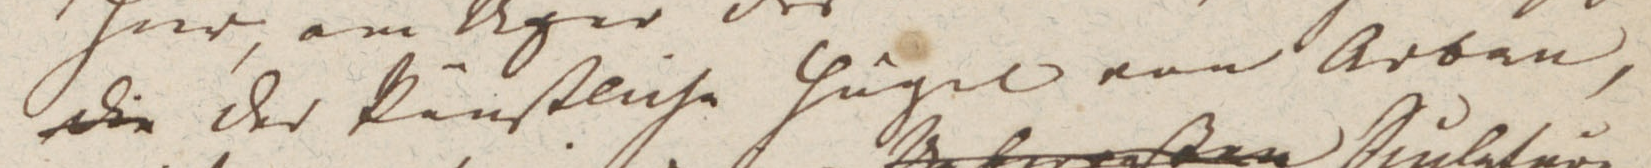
die der künstliche Hügel von Arban,
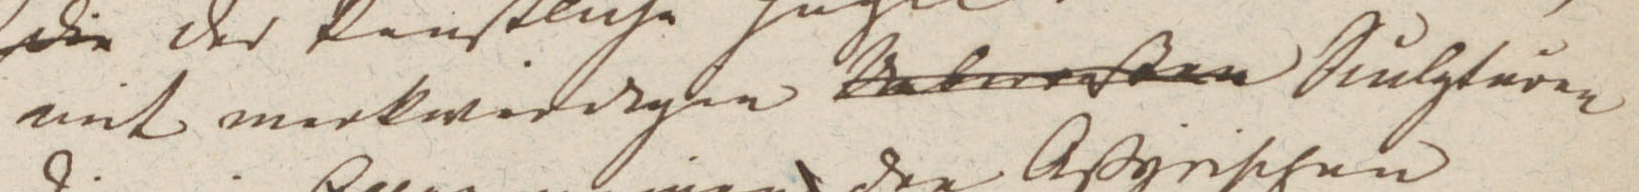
mit merkwürdigen Ueberresten Skulpturen
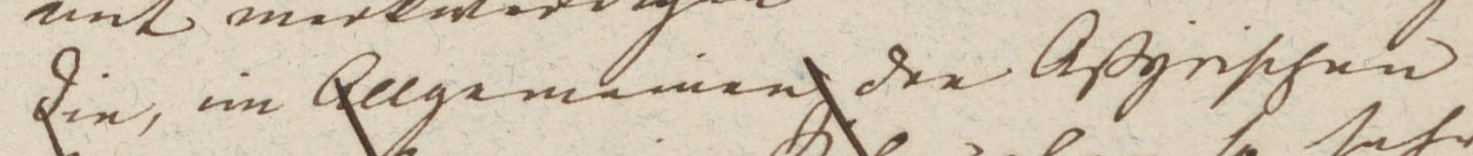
die, im Allgemeinen den Assyrischen
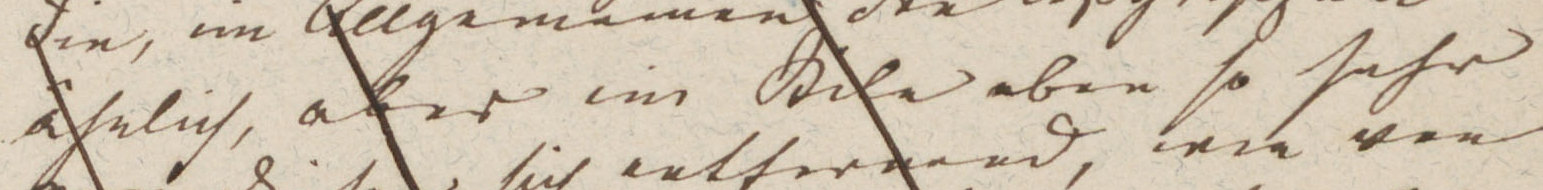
ähnlich, aber im Stile eben so sehr
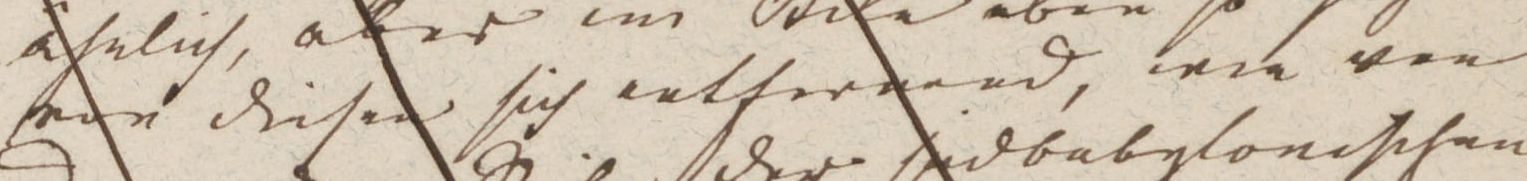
von diesen sich entfernend, wie von
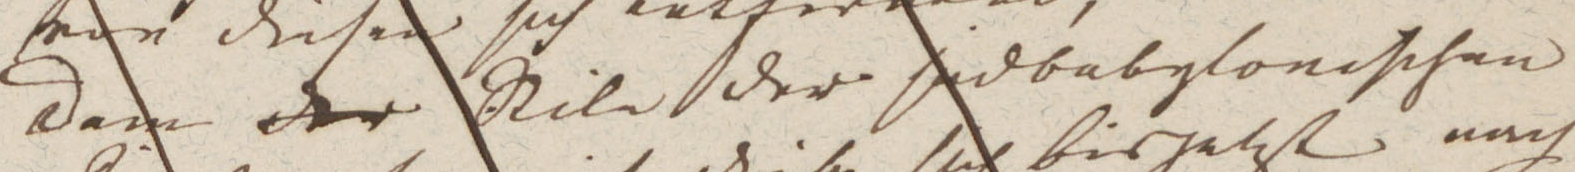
dem der Stile der südbabylonischen
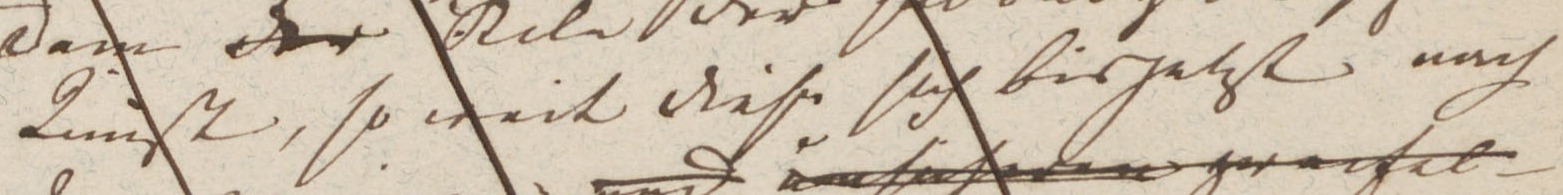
Kunst, so weit diese sich jetzt nach
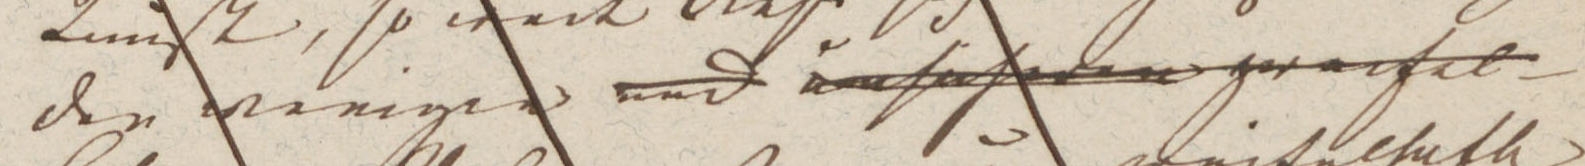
den wenigen und unsicheren zweifel-
